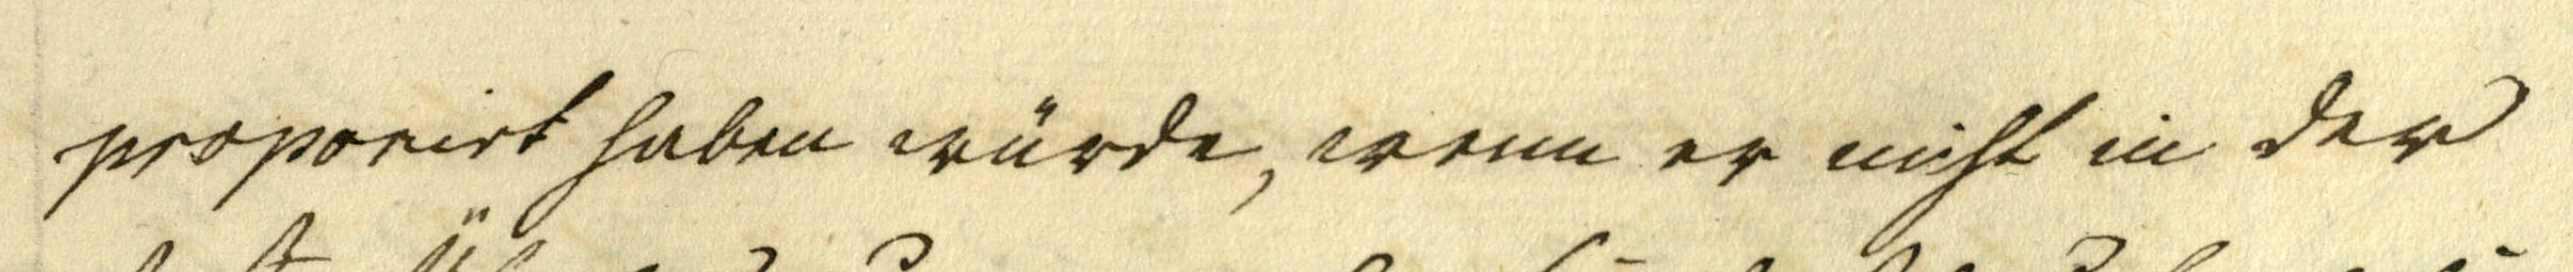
proponirt haben würde, wenn er nicht in der
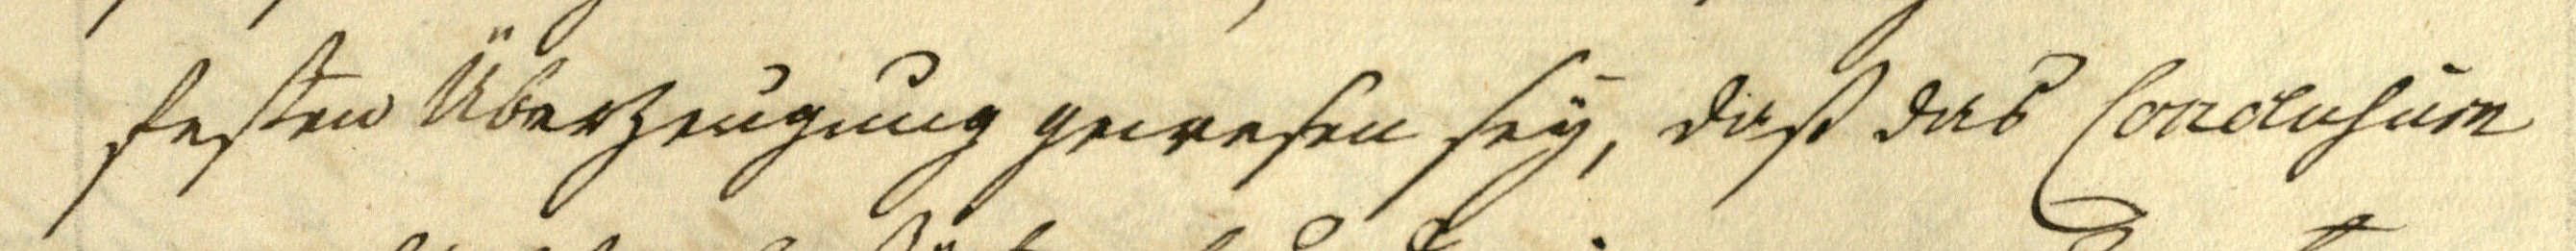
festen Überzeugung gewesen seÿ, daß das Conclusum
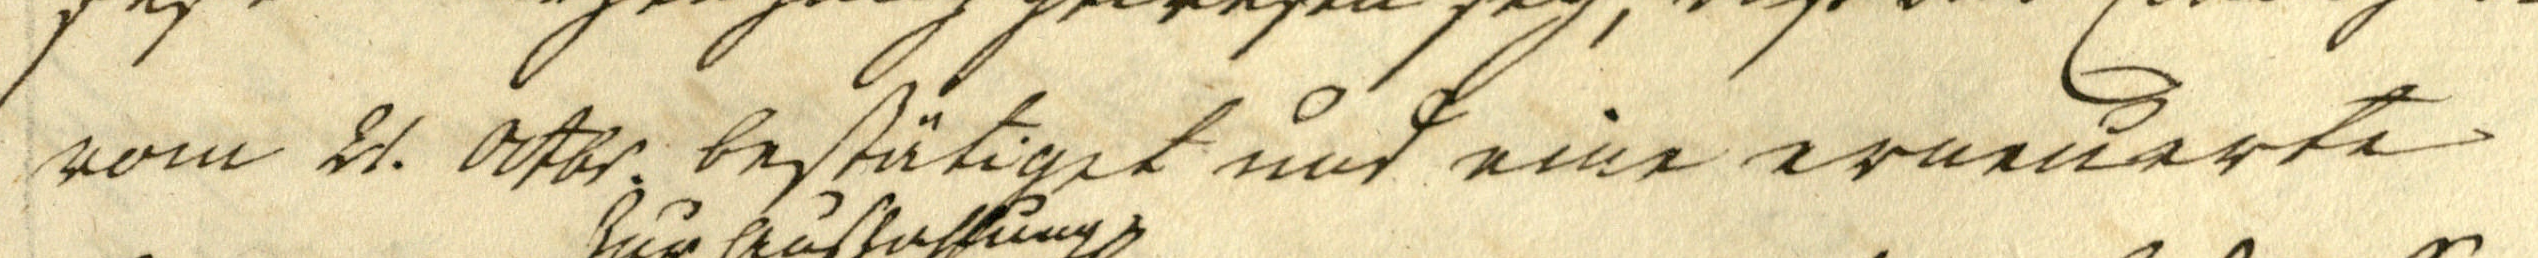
vom 21. Octbr. bestätiget und eine erneuerte
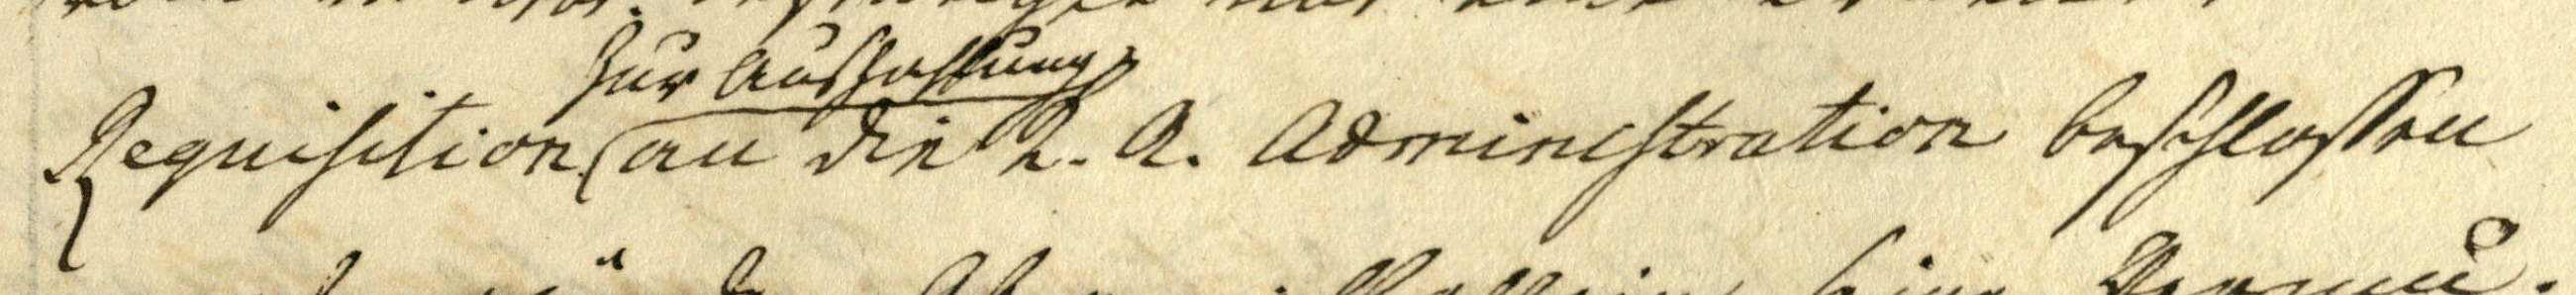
Requisition zur Auszahlung an die K. A. Administration beschlossen
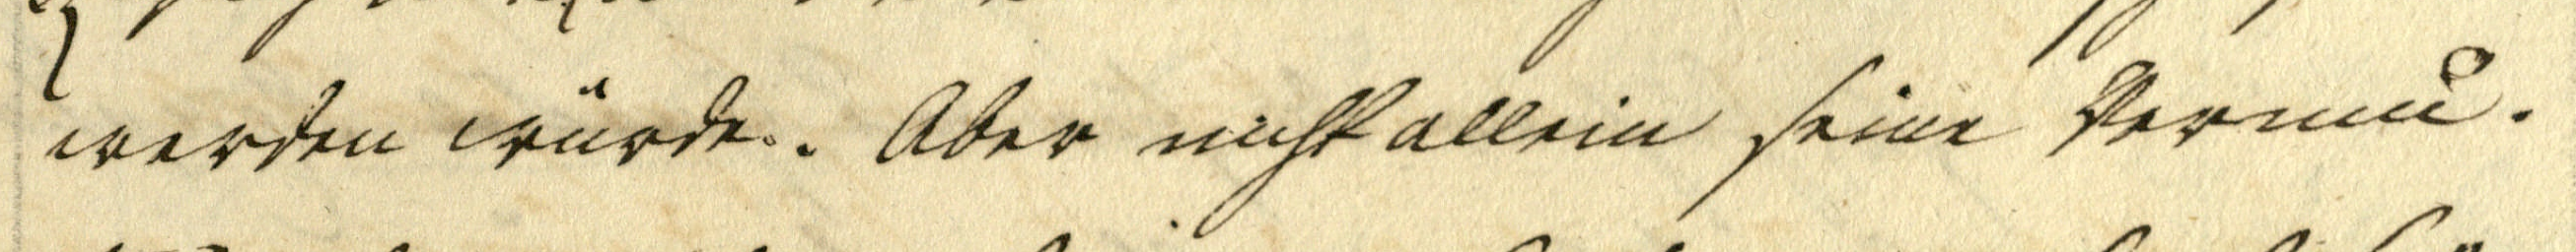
werden würde. Aber nicht allein seine Vermu¬
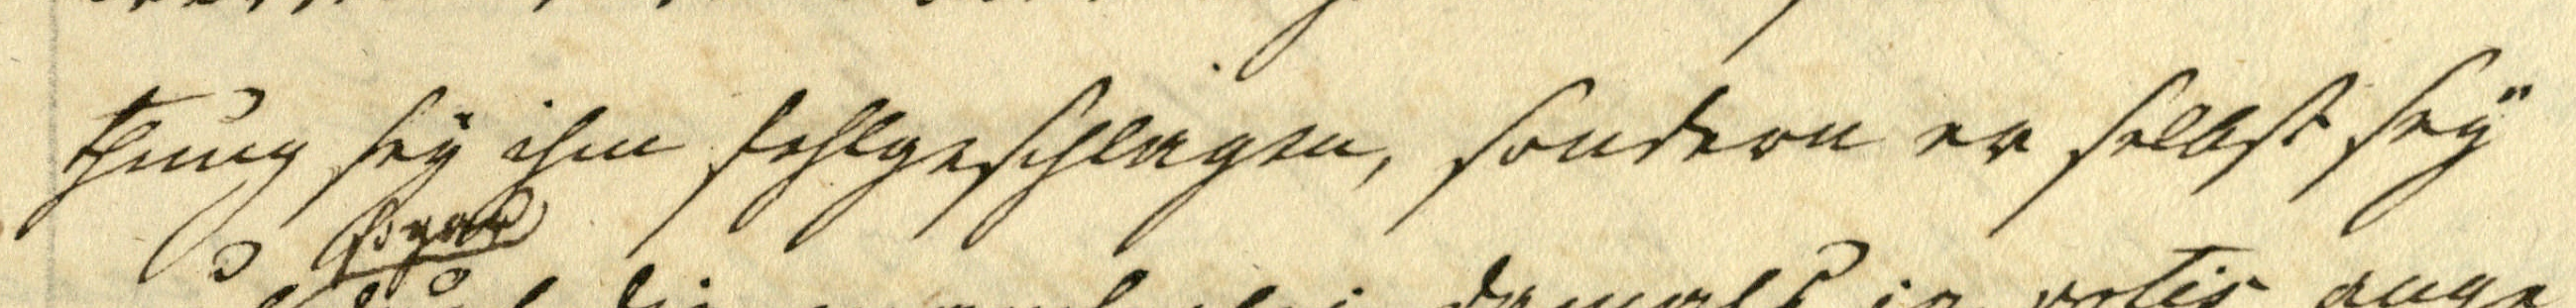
thung seÿ ihm fehlgeschlagen, sondern er selbst seÿ
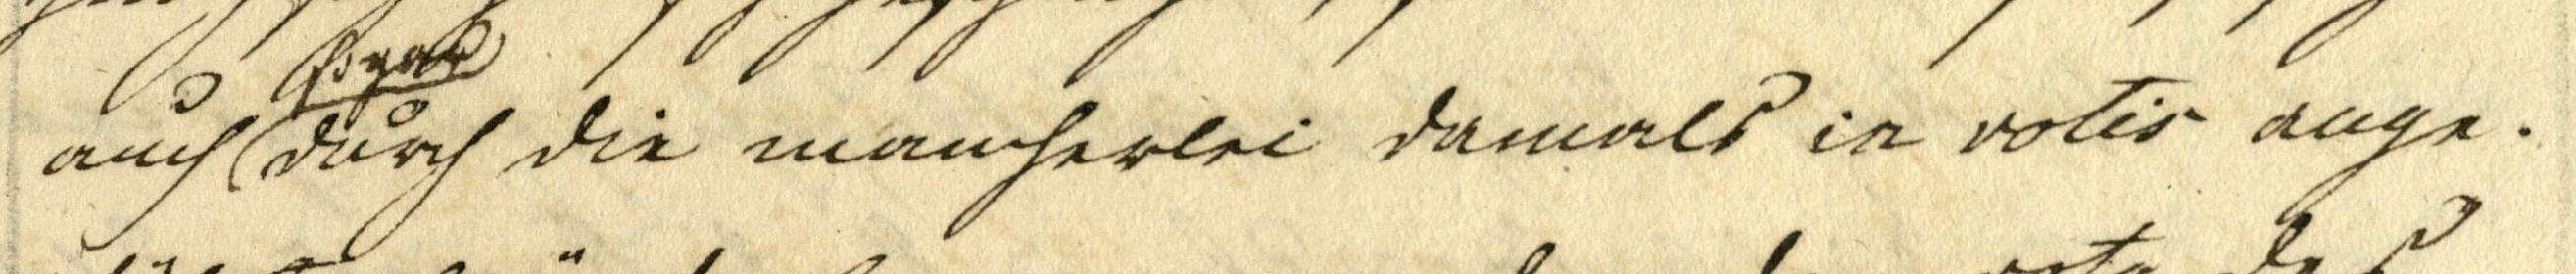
auch so gar durch die mancherlei damals in votis ange¬
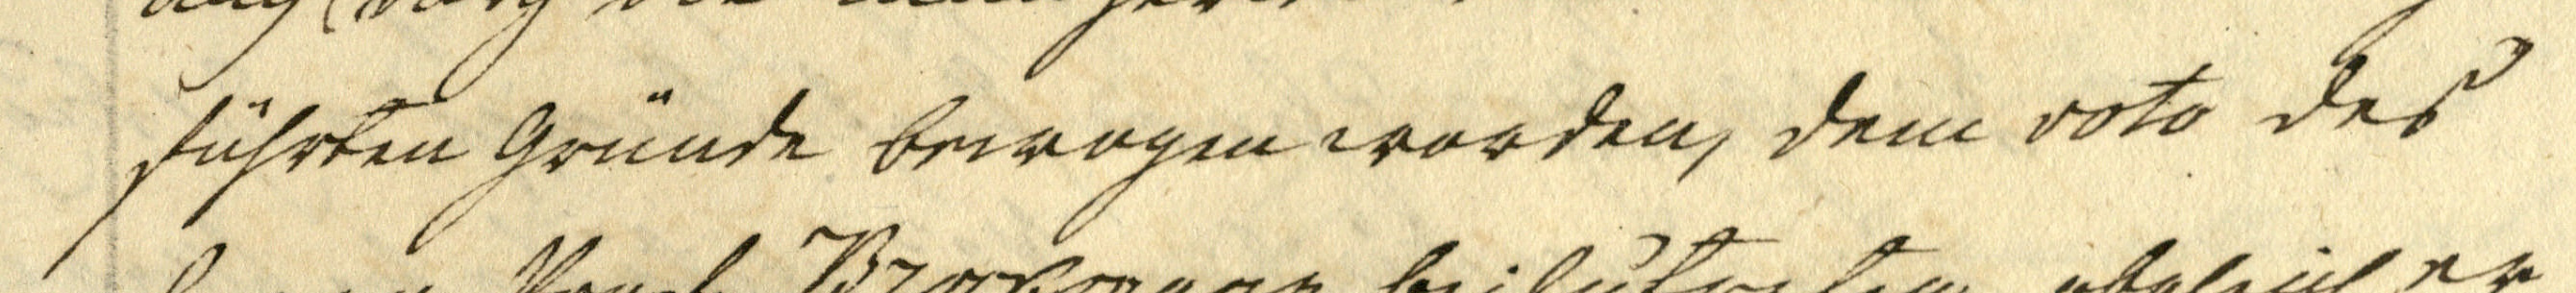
führten Gründe bewogen worden, dem voto des
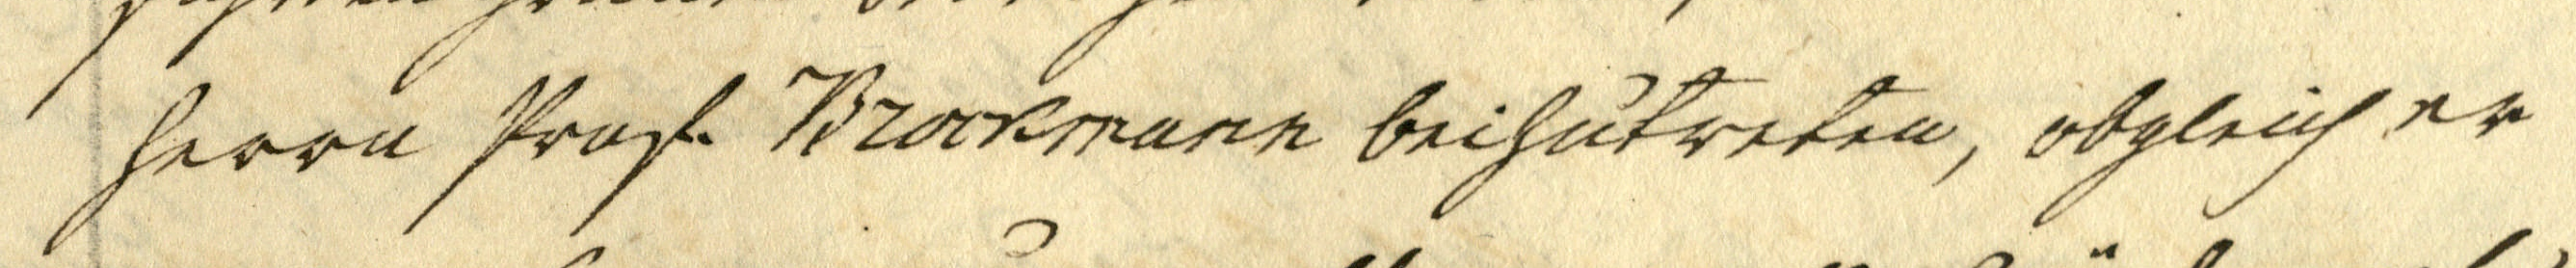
Herrn Prof. Brockmann beizutreten, obgleich er
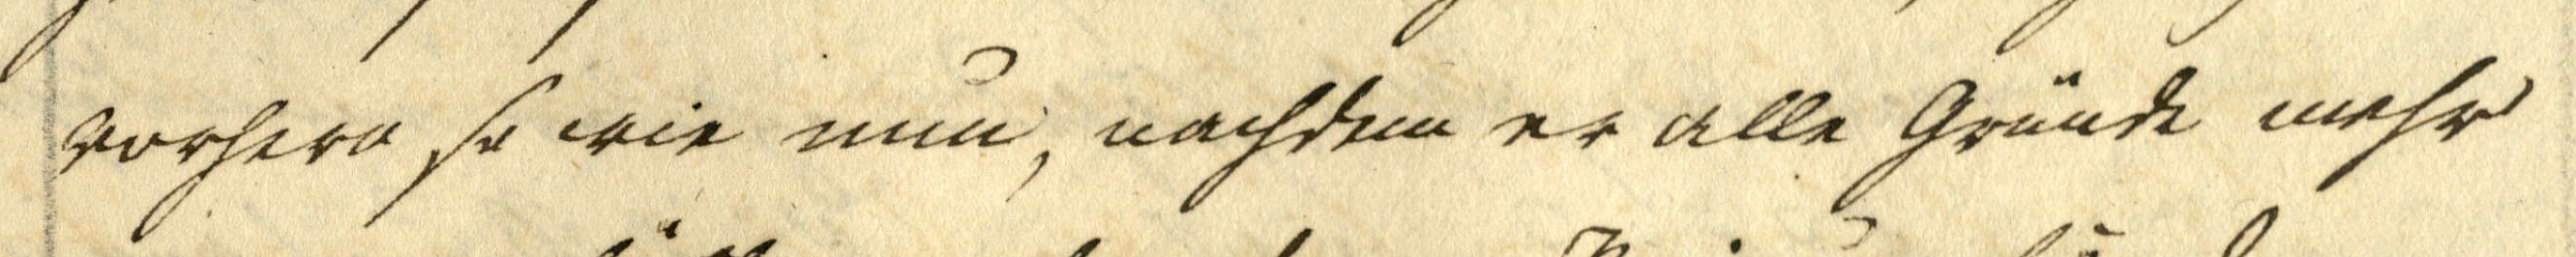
vorhero so wie nun, nachdem er alle Gründe mehr
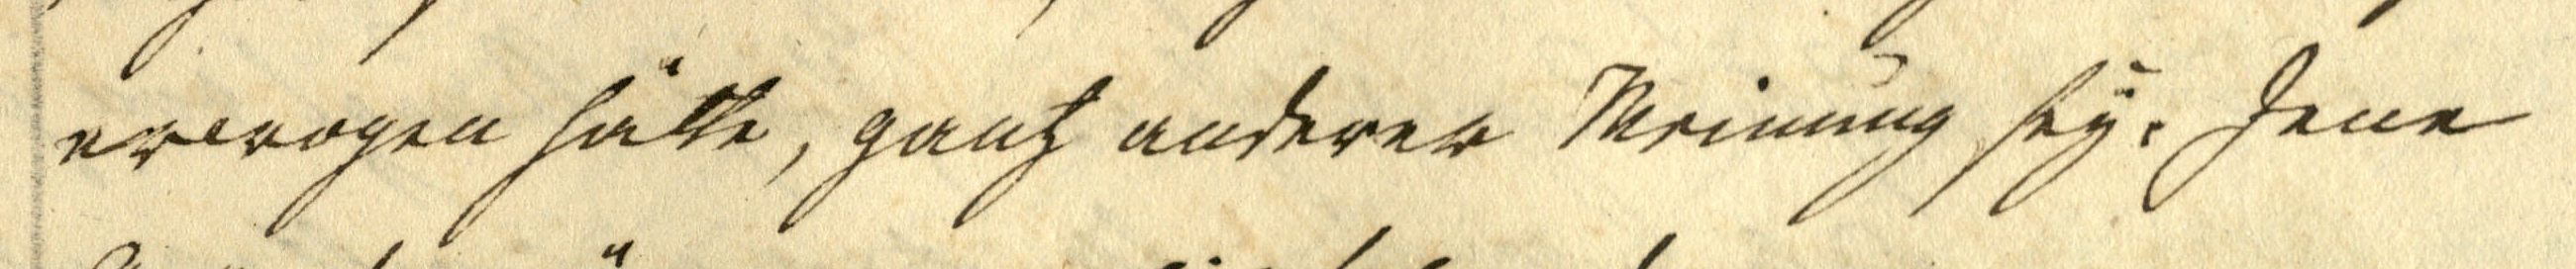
erwogen hätte, gantz anderer Meinung seÿ. Jene
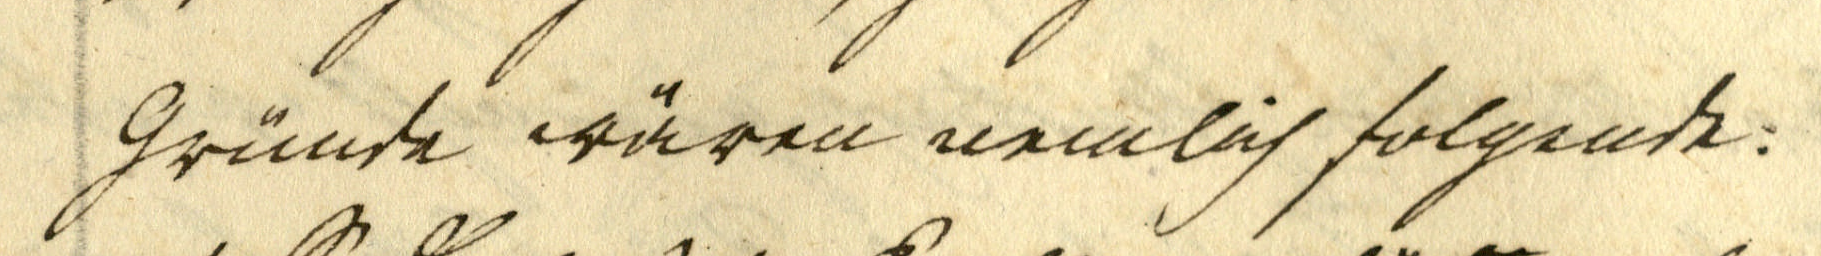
Gründe wären nemlich folgende:
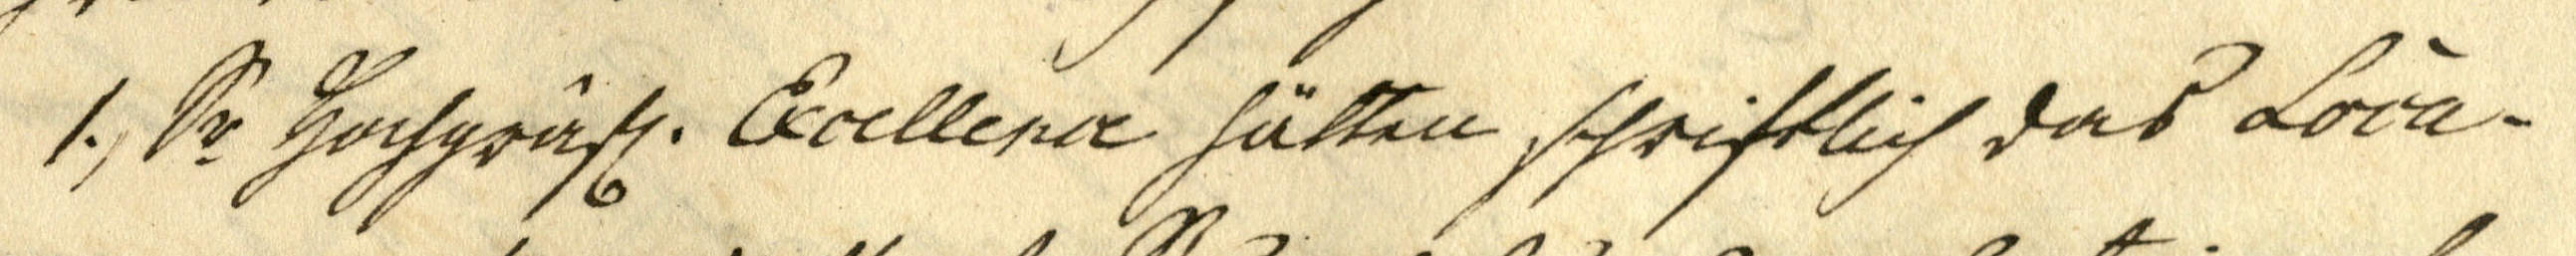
1. Sr Hochgräfl. Excellence hätten schriftlich das Loca¬
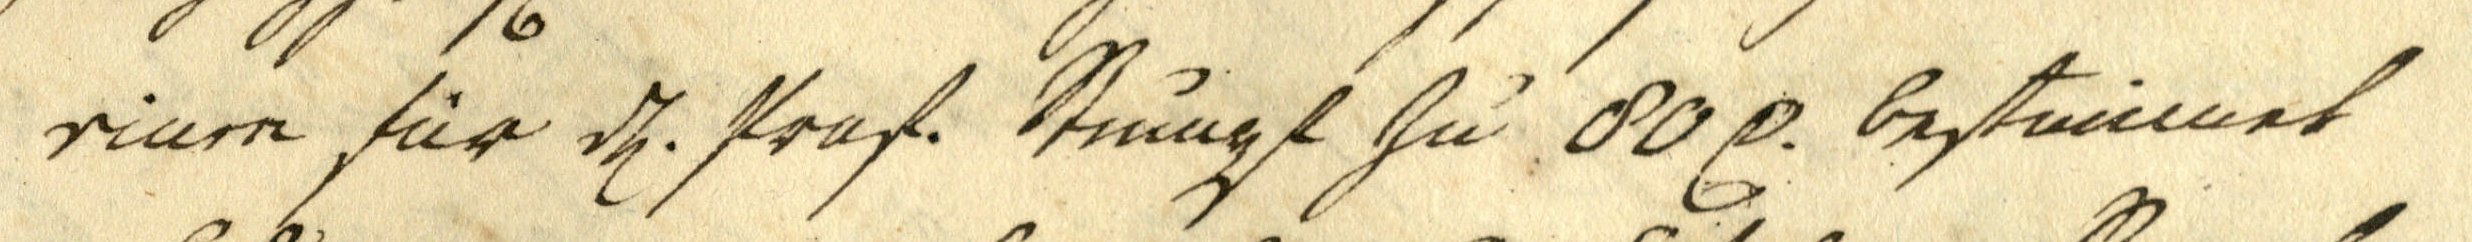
rium für dh. Prof. Stumpf zu 80 l. bestimmet
